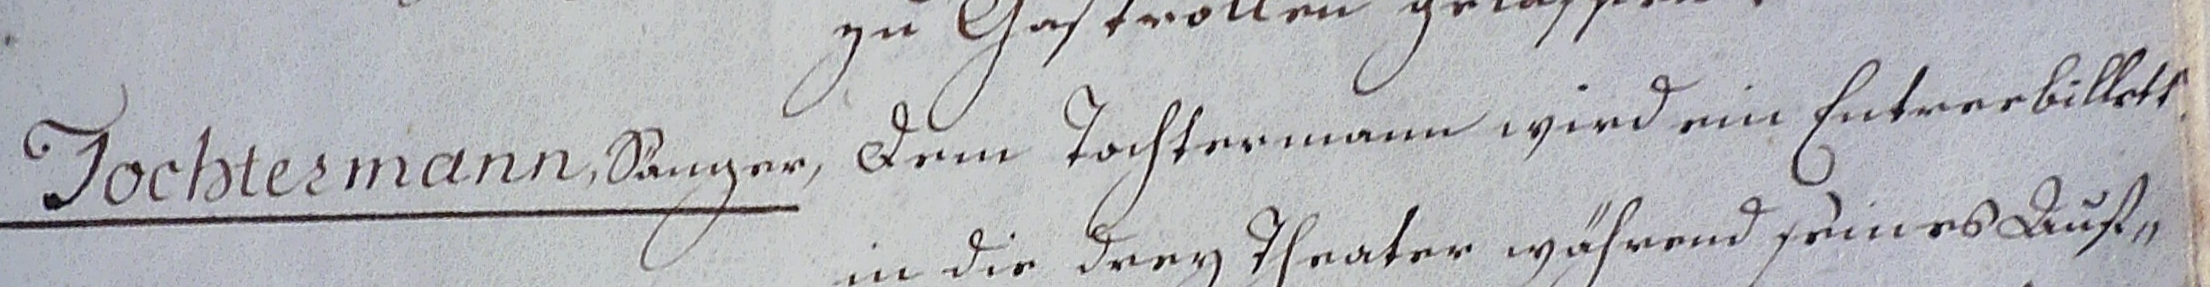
Tochtermann, Sänger, Dem Tochtermann wird ein Entreebillett
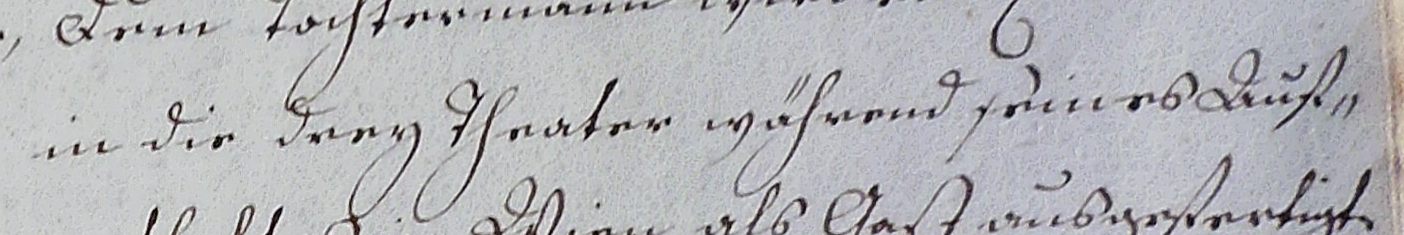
in die drey Theater während seines Auf¬
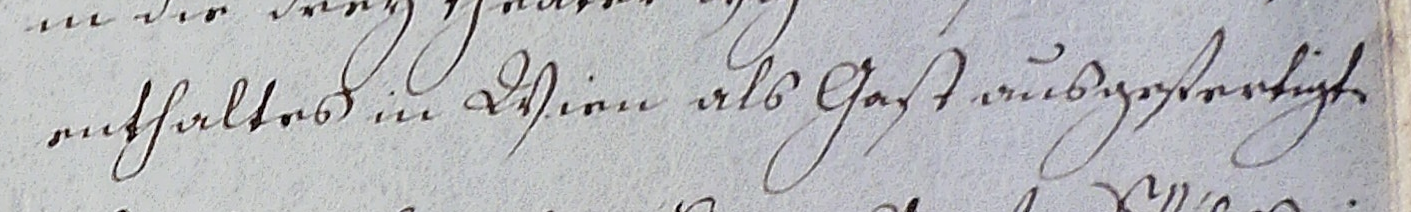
enthaltes in Wien als Gast ausgefertigt.
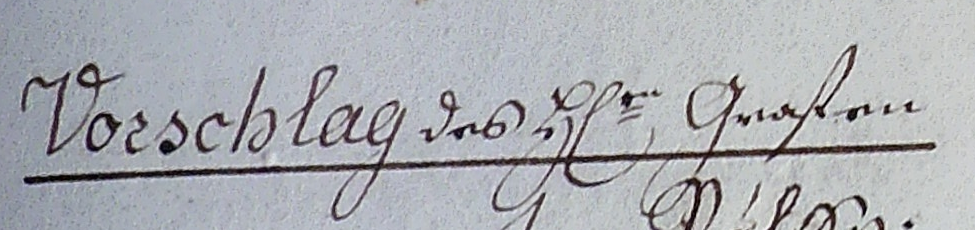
Vorschlag des HEr͇n Grafen
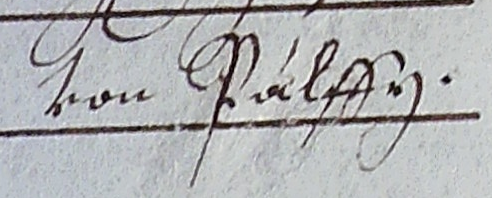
von Pálffy.
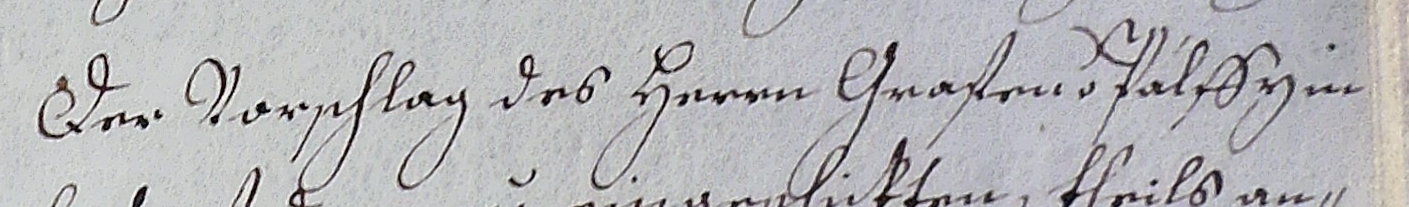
Der Vorschlag des Herrn Grafen v Pálffy im
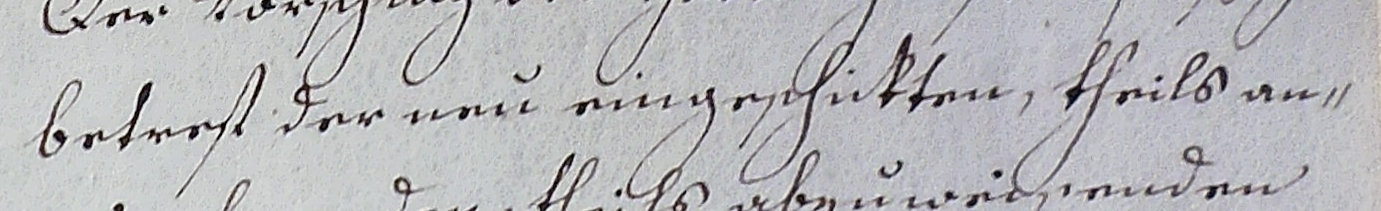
betref der neu eingeschickten, theils an¬
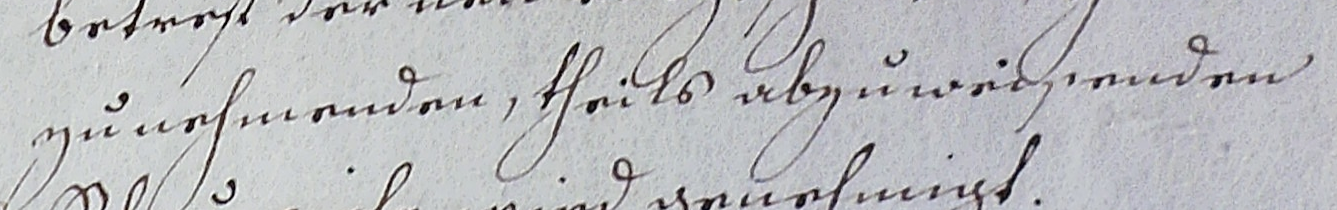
zunehmenden, theils abzuweisenden
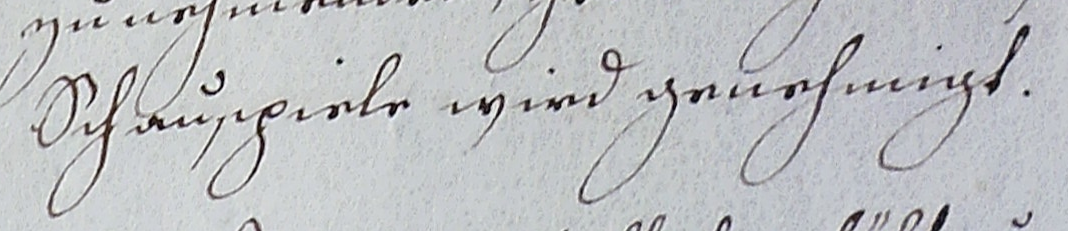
Schauspiele wird genehmigt.
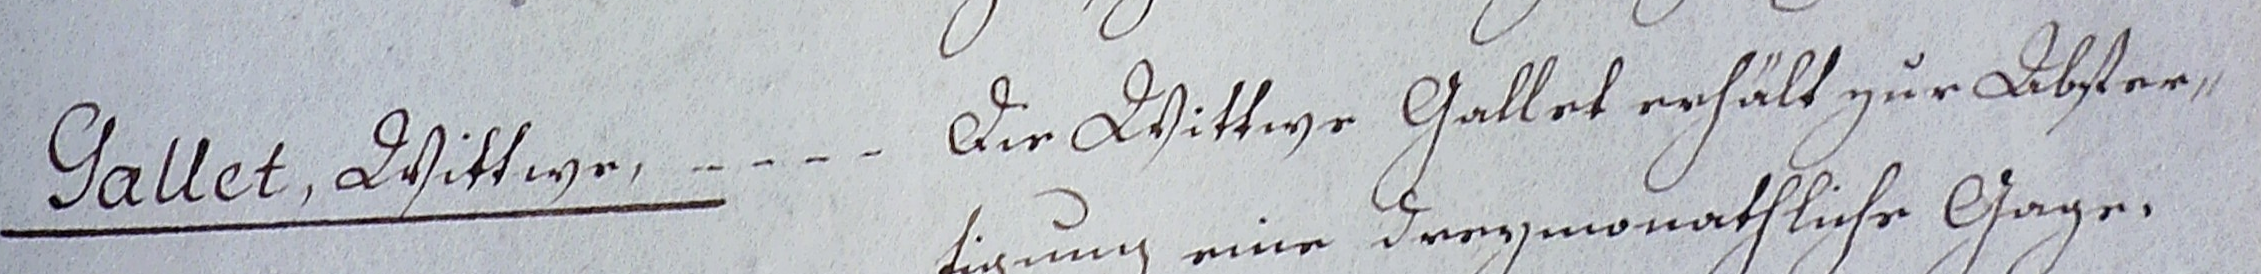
Gallet, Witwe, .. .. .. .. Die Wittwe Gallet erhält zur Abfer¬
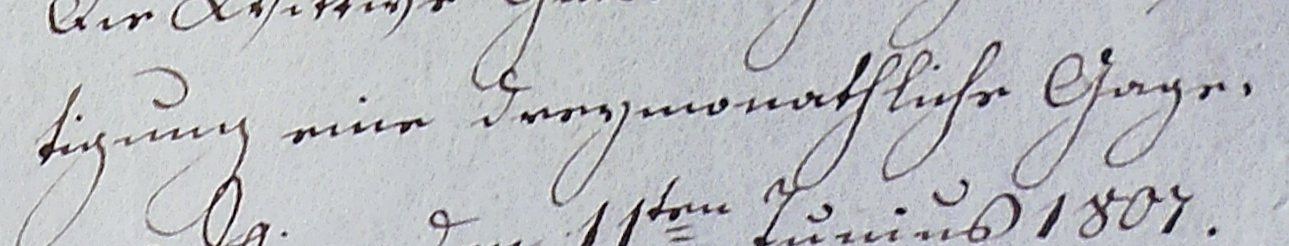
tigung eine dreymonathliche Gage.
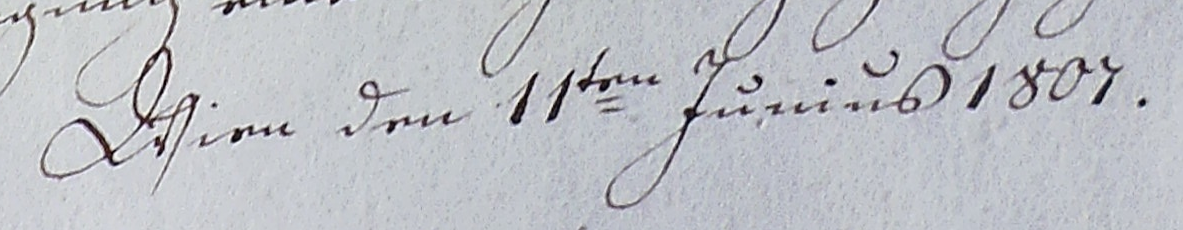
Wien den 11te͇n Junius 1807.
